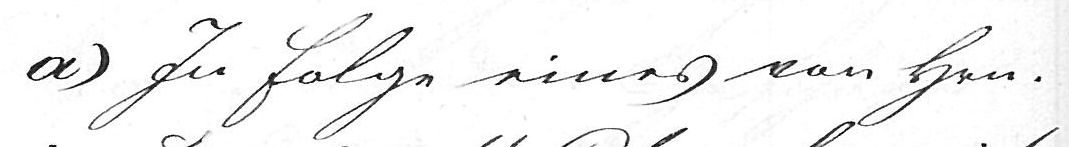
a) In Folge eines von Hrn.
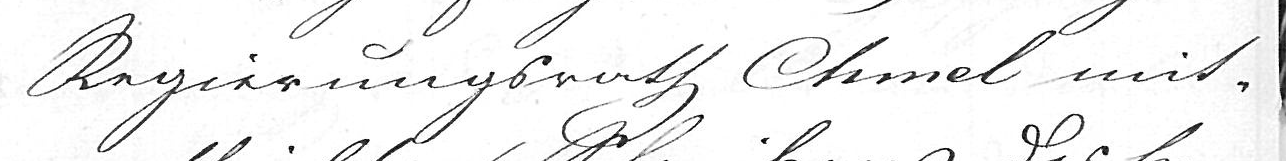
Regierungsrath Chmel mit-
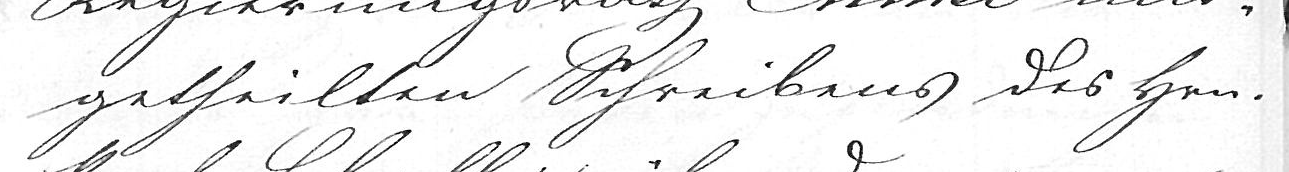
getheilten Schreibens des Hrn.
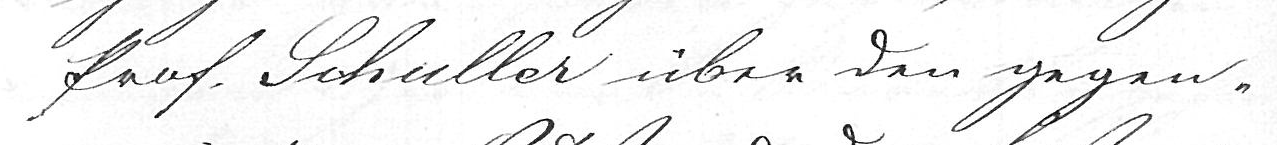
Prof. Schuller über den gegen-
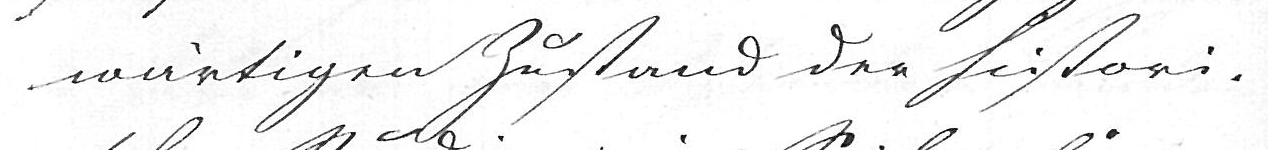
wärtigen Zustand der histori-
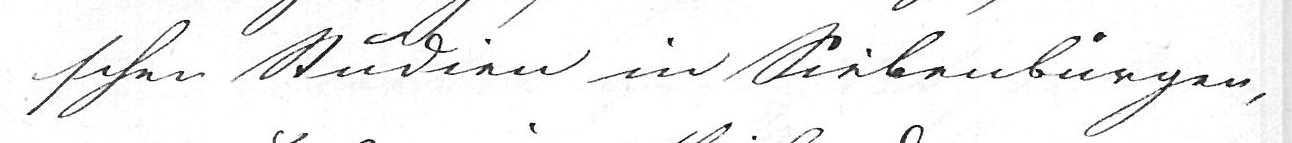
schen Studien in Siebenbürgen,
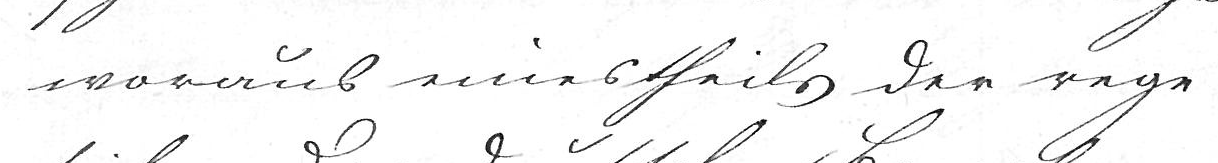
woraus einesheils der rege
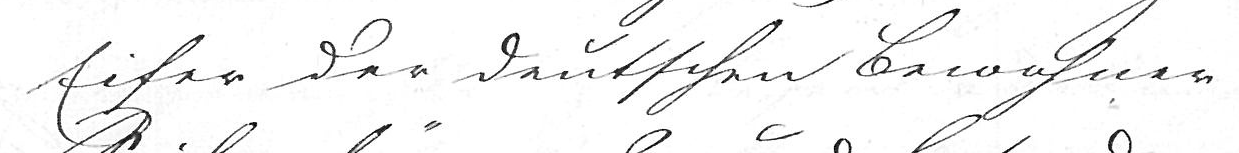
Eifer der deutschen Bewohner
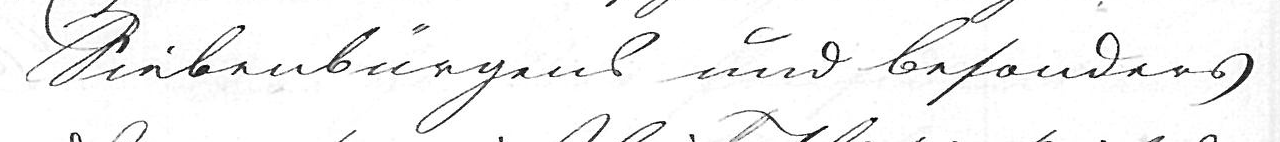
Siebenbürgens und besonders
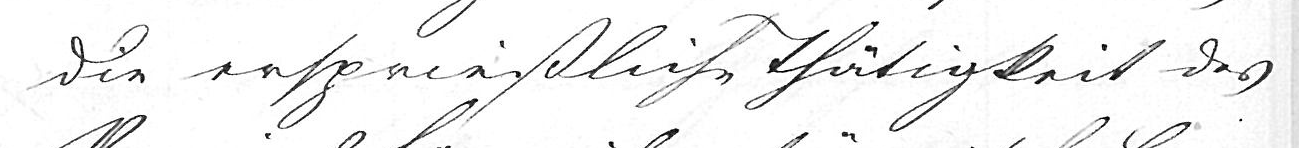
die ersprießliche Thätigkeit des
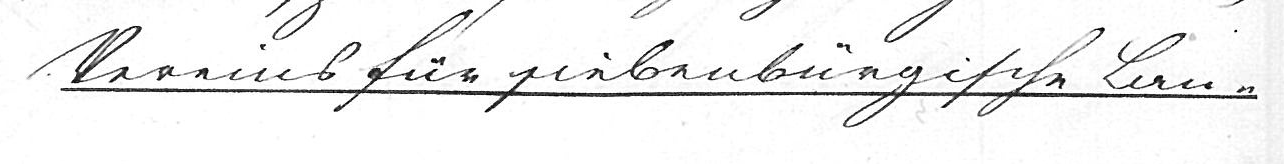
Vereins für siebenbürgische Lan-
